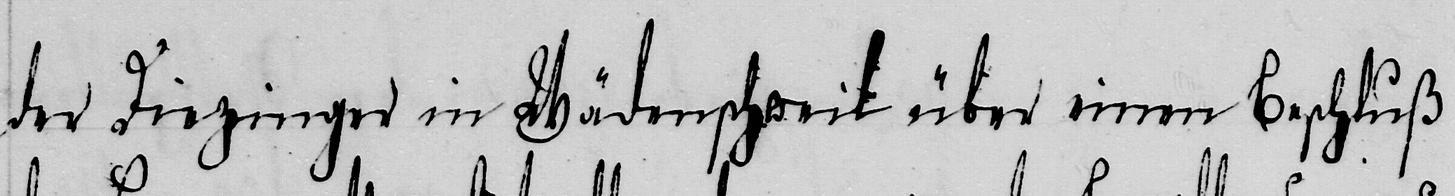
der Diezinger in Wädenschweil über einen Beschluß
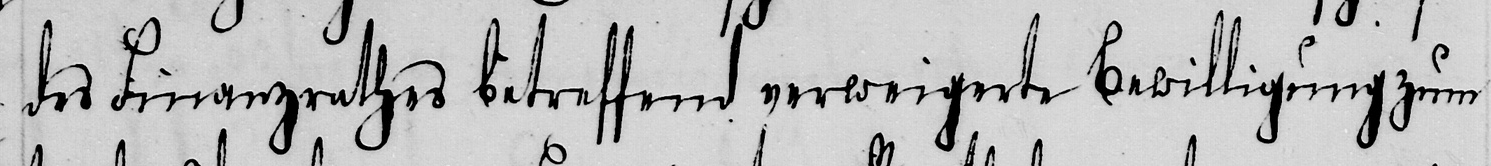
des Finanzrathes betreffend verweigerte Bewilligung zum
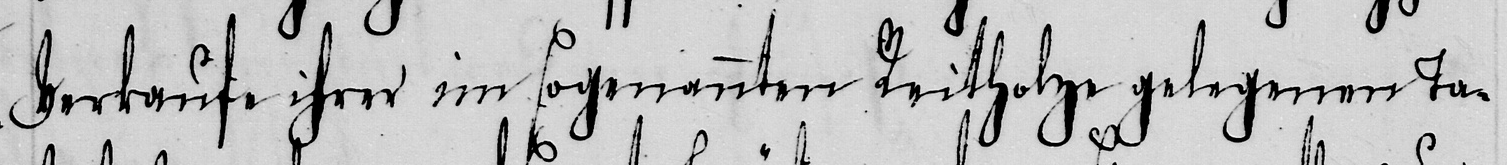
Verkaufe ihrer im sogenannten Reitholze gelegenen Ta¬
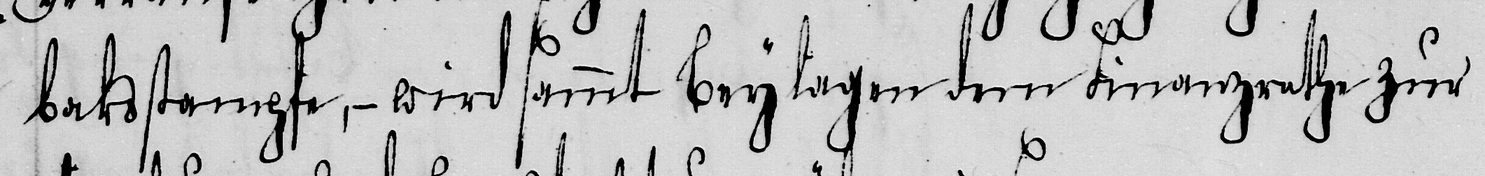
baksstampfe, – wird sammt Beylagen dem Finanzrathe zur
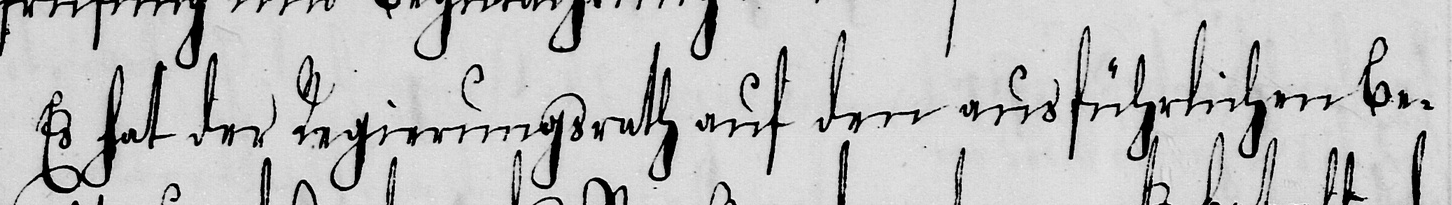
Es hat der Regierungsrath auf den ausführlichen Be¬
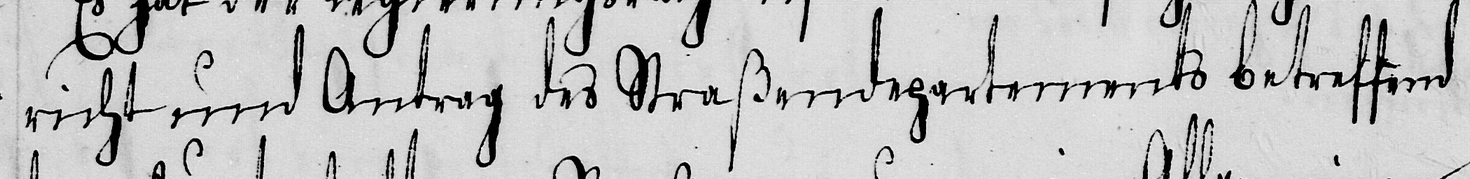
richt und Antrag des Straßendepartements betreffend
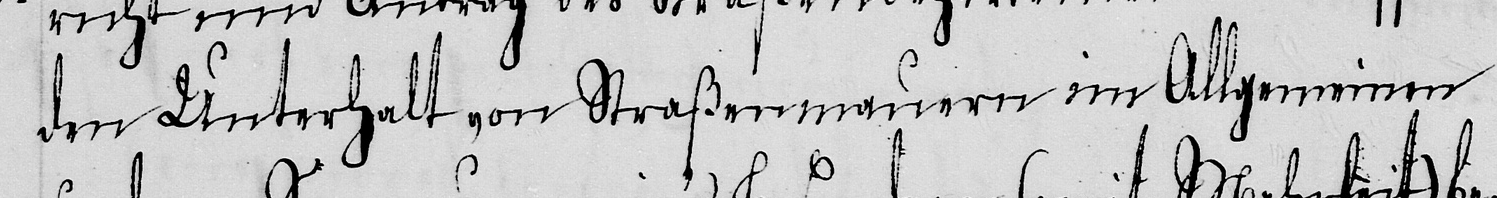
den Unterhalt von Straßenmauern im Allgemeinen
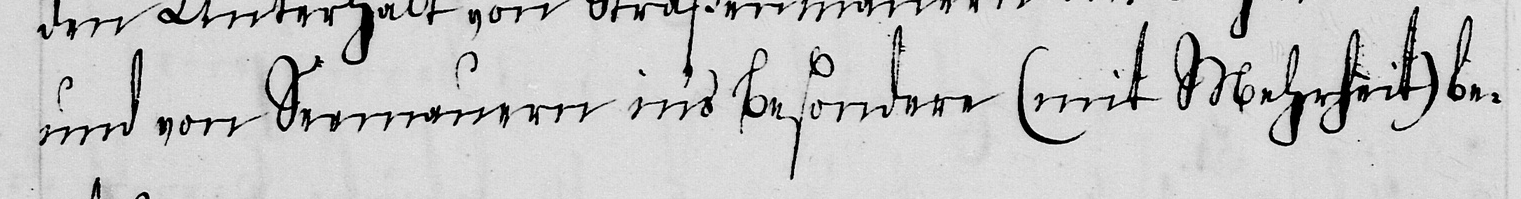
und von Seemauern in’s Besondere (mit Mehrheit) be¬
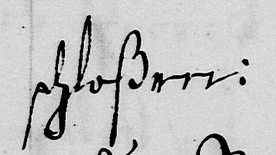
schloßen:
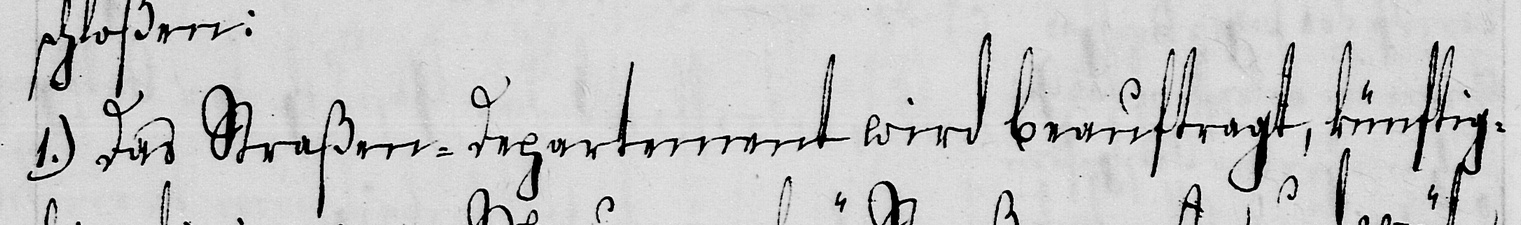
1.) Das Straßenbau-Departement wird beauftragt, künftig¬
